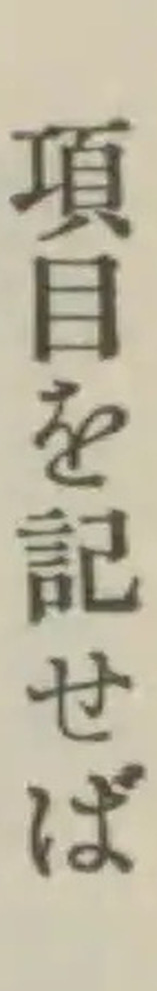項目を記せば
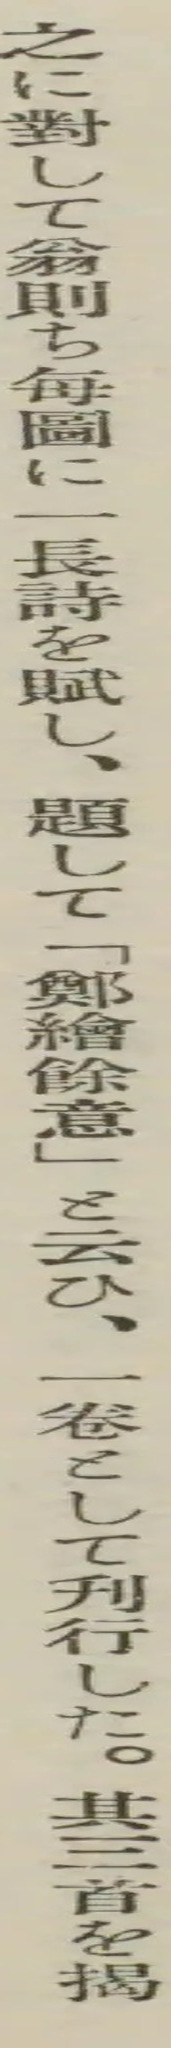之に対して翁則ち毎図に一長詩を賦し、題して「鄭絵余意」と云ひ、一巻として刊行した。其三首を掲
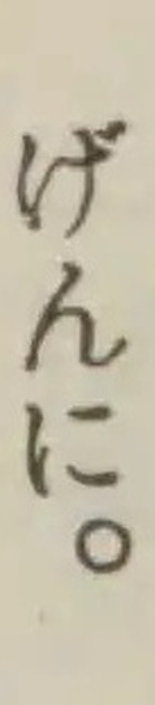げんに。
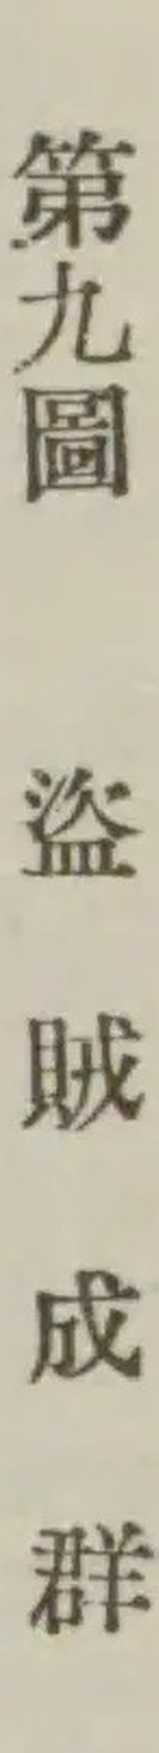第九図盗賊成群
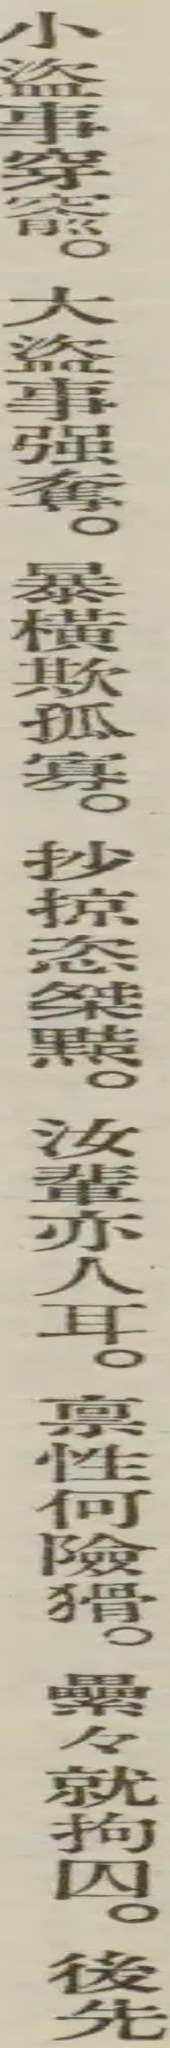小盗事穿窬。大盜事強奪。暴横欺孤寡。抄掠恣桀黠。汝輩亦人耳。稟性何險猾。纍々就拘囚。後先
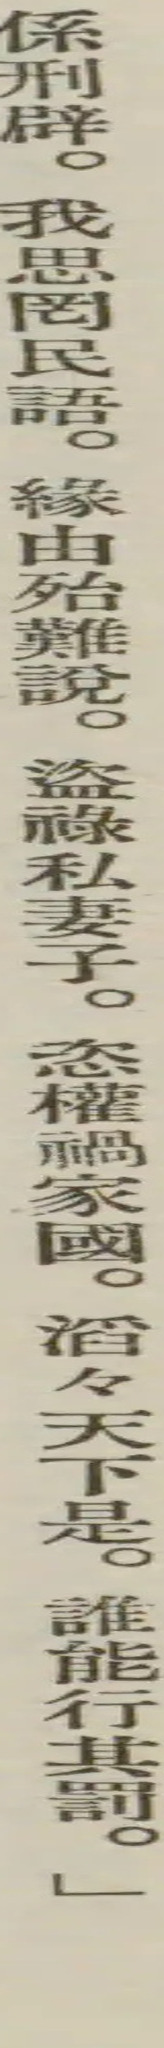係刑辟。我思罔民語。緣由殆難説。盜祿私妻子。恣權禍家國。滔々天下是。誰能行其罰。」
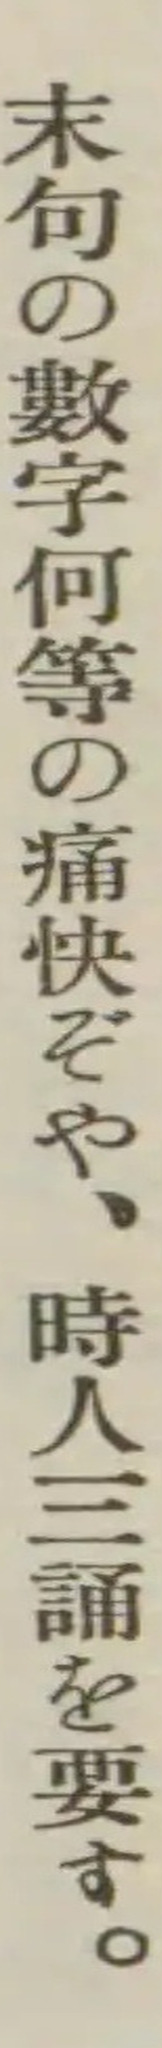末句の数字何等の痛快ぞや、時人三誦を要す。
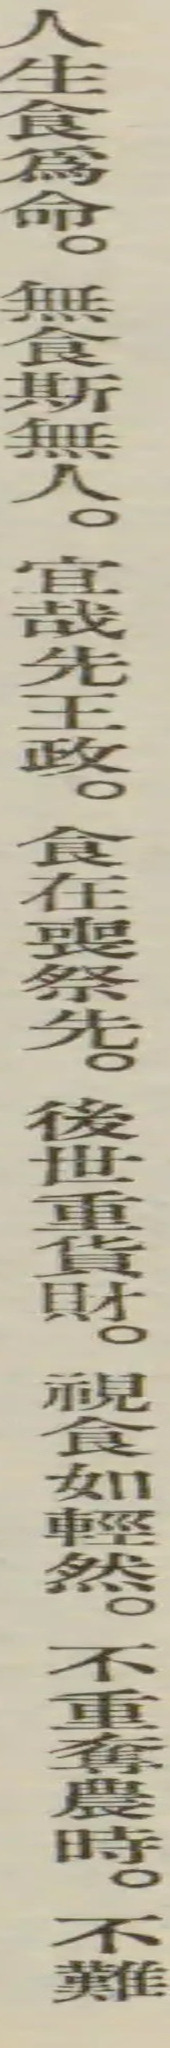人生食爲命。無食斯無人。宜哉先王政。食在喪祭先。後世重貨財。視食如輕然。不重奪農時。不難
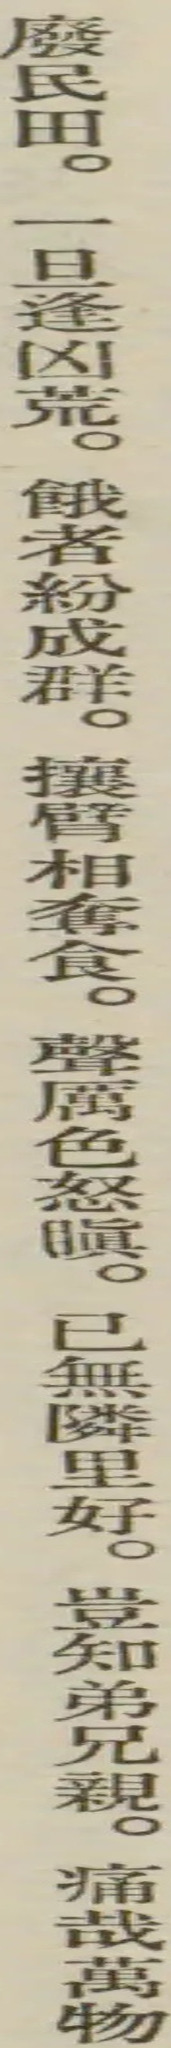廢民田。一旦逢凶荒。餓者紛成群。攘臂相奪食。聲厲色怒瞋。已無隣里好。豈知弟兄親。痛哉萬物

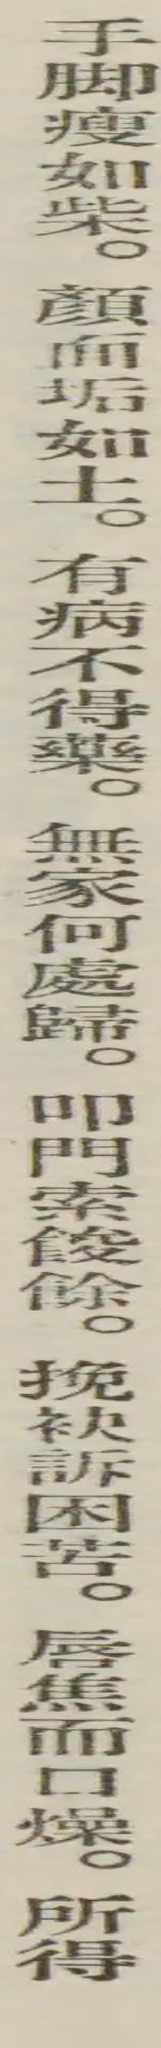手脚瘦如柴。顔面垢如土。有病不得藥。無家何處歸。叩門索餕餘。挽袂訴困苦。唇焦而口燥。所得
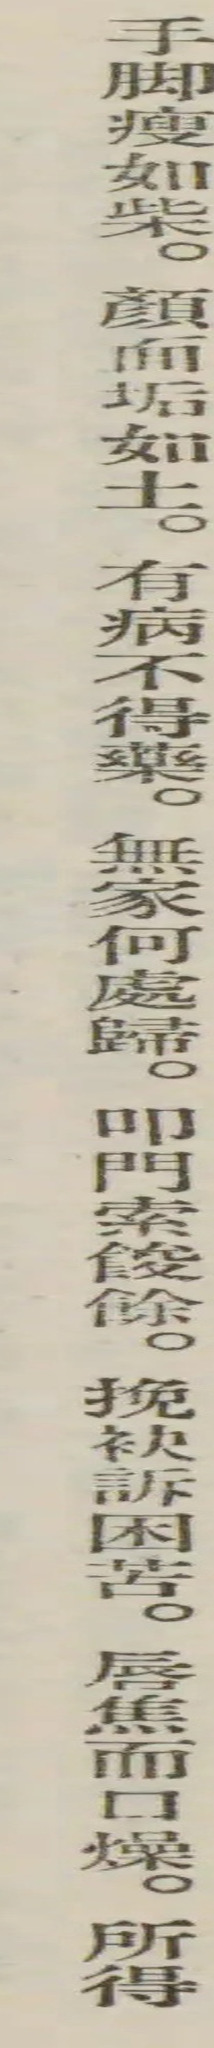手脚瘦如柴。顔面垢如土。有病不得藥。無家何處歸。叩門索餕餘。挽袂訴困苦。唇焦而口燥。所得
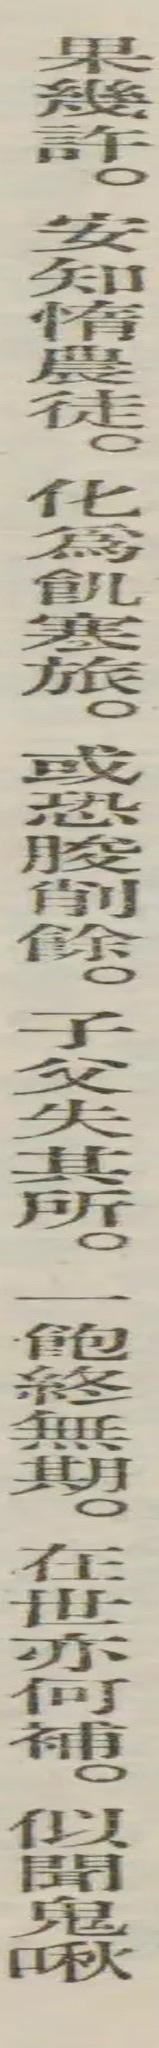果幾許。安知惰農徒。化爲飢寒旅。或恐脧削餘。子父失其所。一飽終無期。在世亦何補。似聞鬼啾
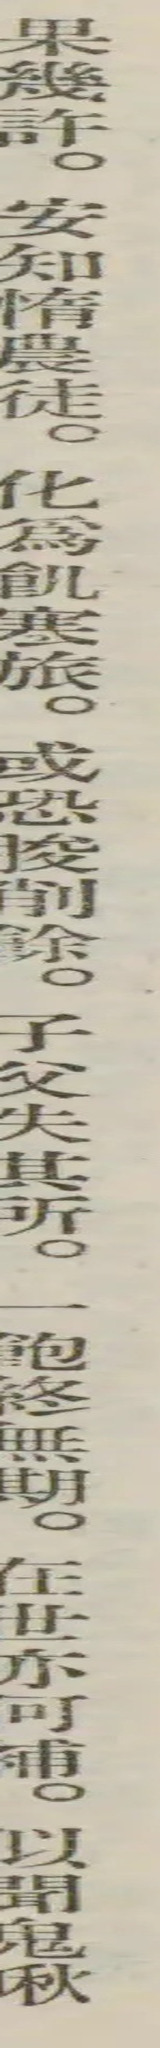果幾許。安知惰農徒。化爲飢寒旅。或恐脧削餘。子父失其所。一飽終無期。在世亦何補。似聞鬼啾
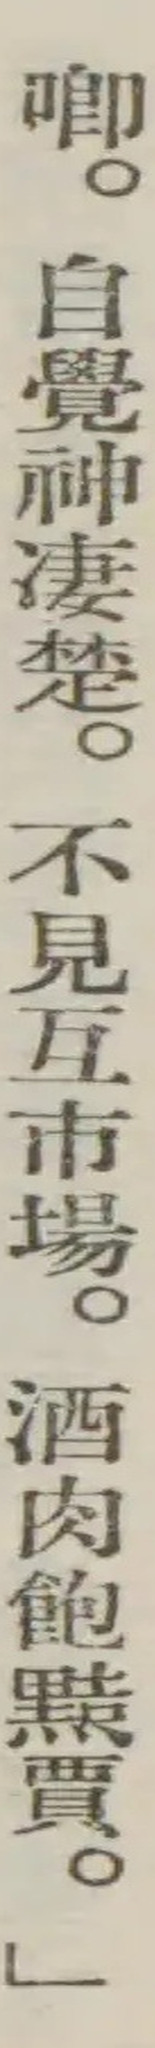喞。自覺神凄楚。不見互市場。酒肉飽黠賈。」
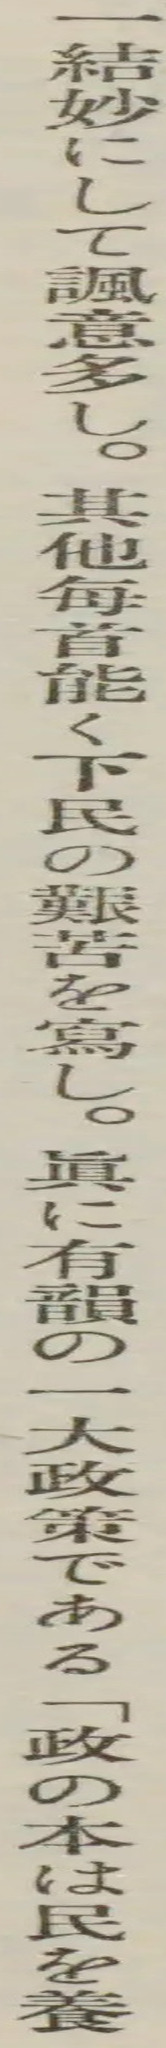一結妙にして諷意多し。其他毎首能く下民の難苦を写し。真に有韻の一大政策である「政の本は民を養
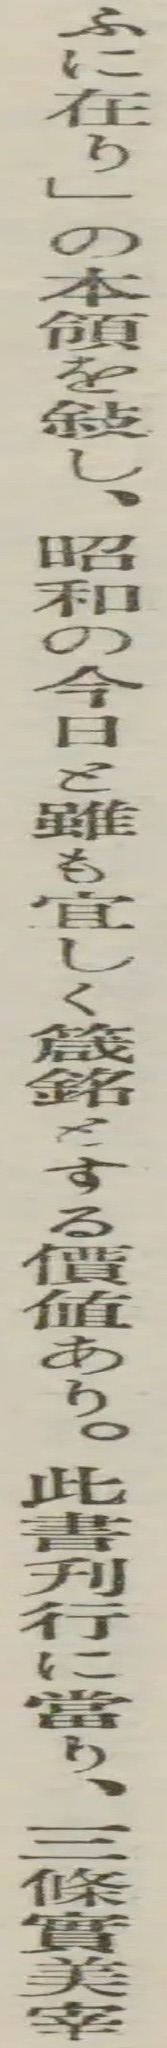ふに在り」の本領を叙し、昭和の今日と雖も宜しく箴銘とする価値あり。此書刊行に当り、三條實美宰
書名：小野湖山翁小伝
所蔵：国立国会図書館 National Diet Library, JAPAN
